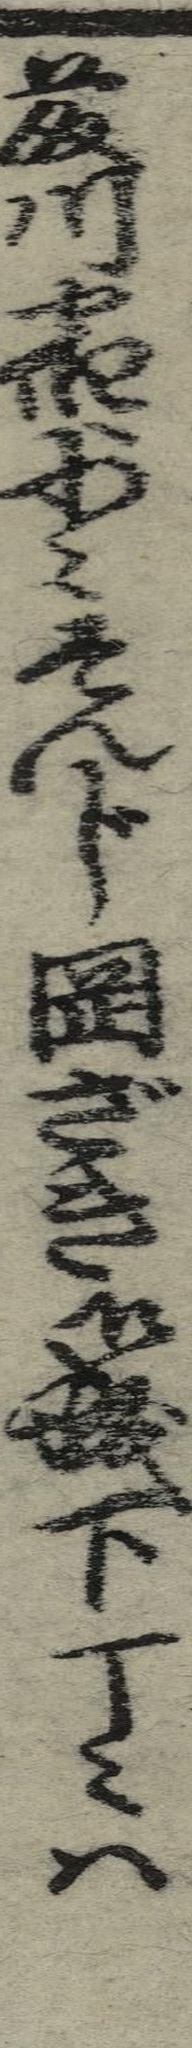藤川宿少々そんじ岡ざき御城下丁々ハ
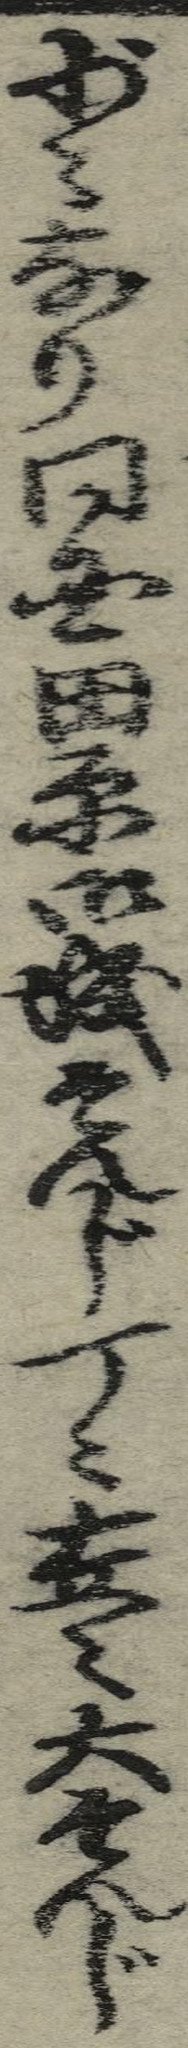少々なり同国田原御城そんじ丁々在々大そんじ
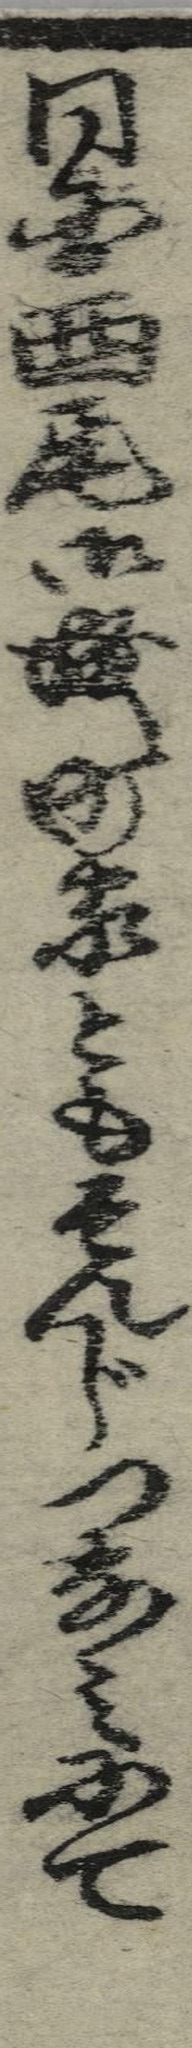同国西尾御城町家ともそんじつなミにて
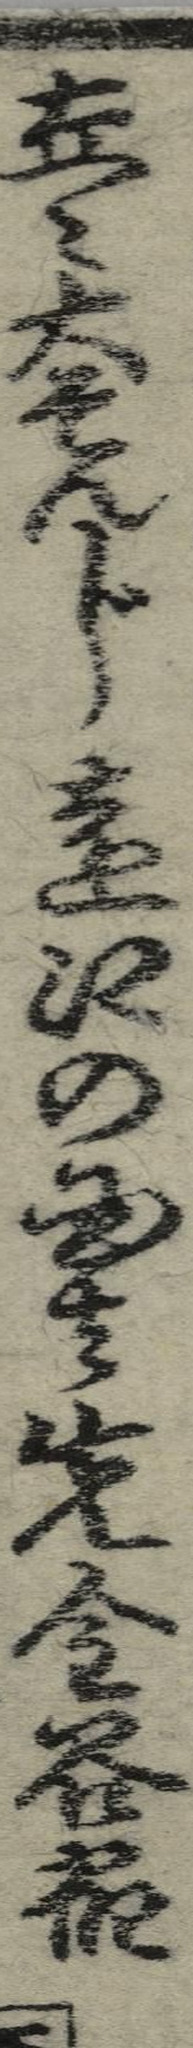在々大そんじ遠江の石は先金谷宿
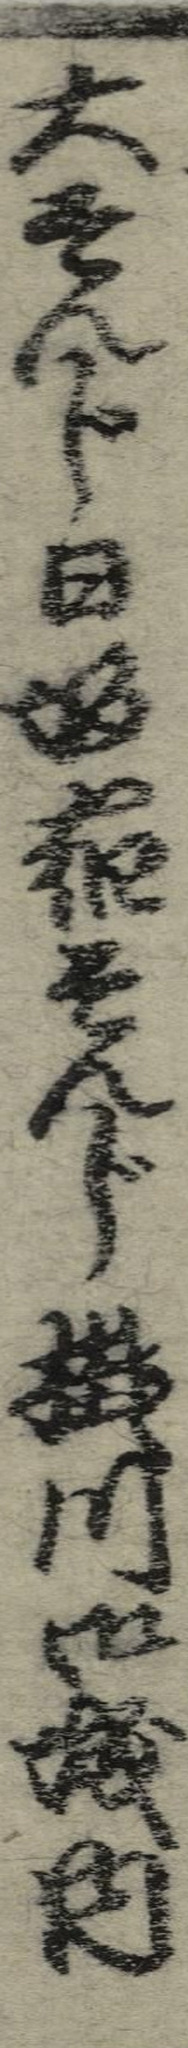大そんじ日坂宿そんじ掛川御城内
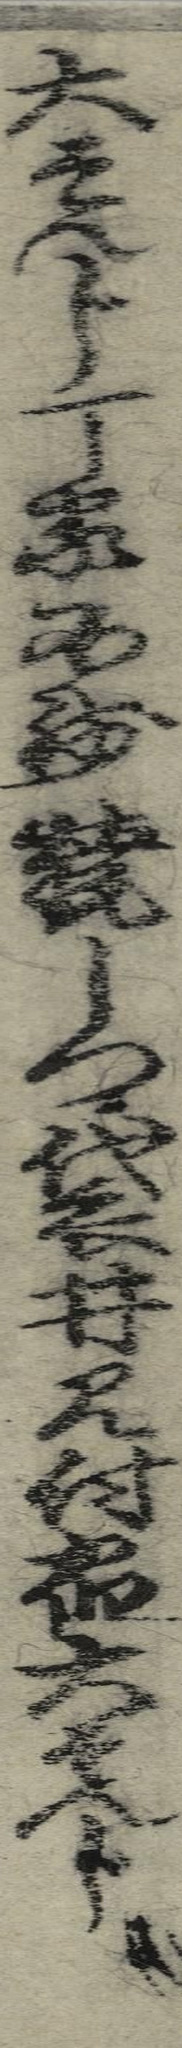大そんじ丁家不残焼しつ袋井見付宿大そんじ
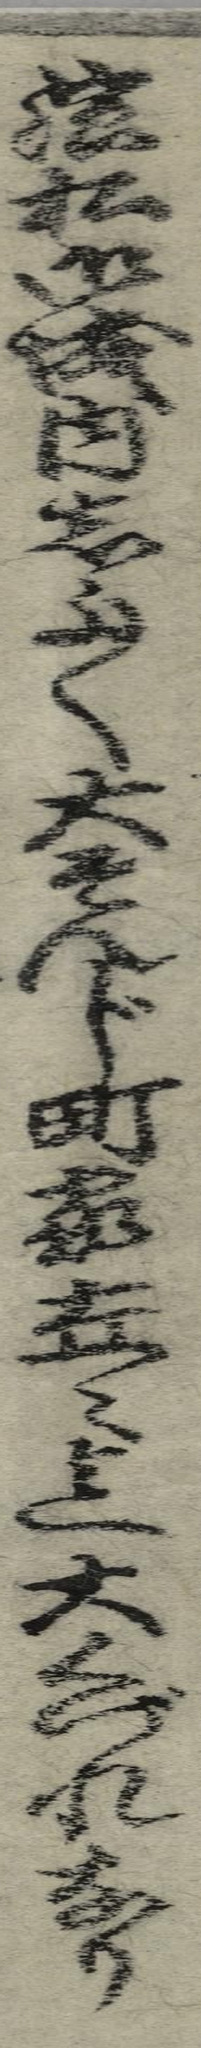濱松御城内しぶ〳〵大そんじ町家在々迄大くずれなり
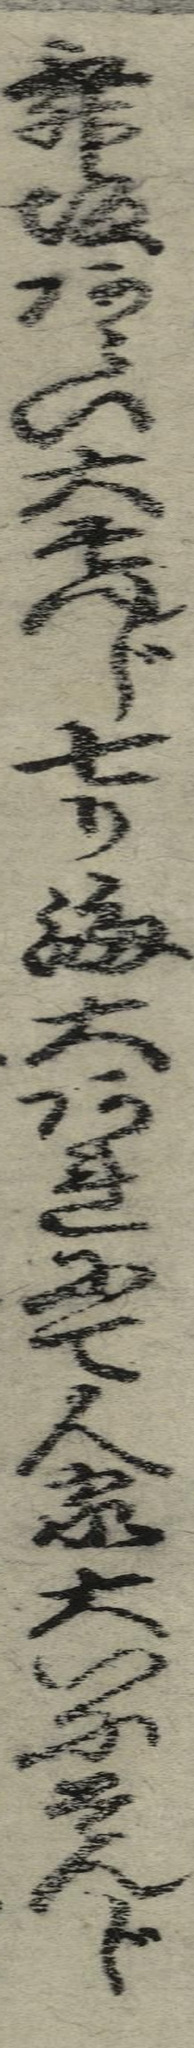舞坂あらい大そんじ七り海大あれにて人家大いにそんじ
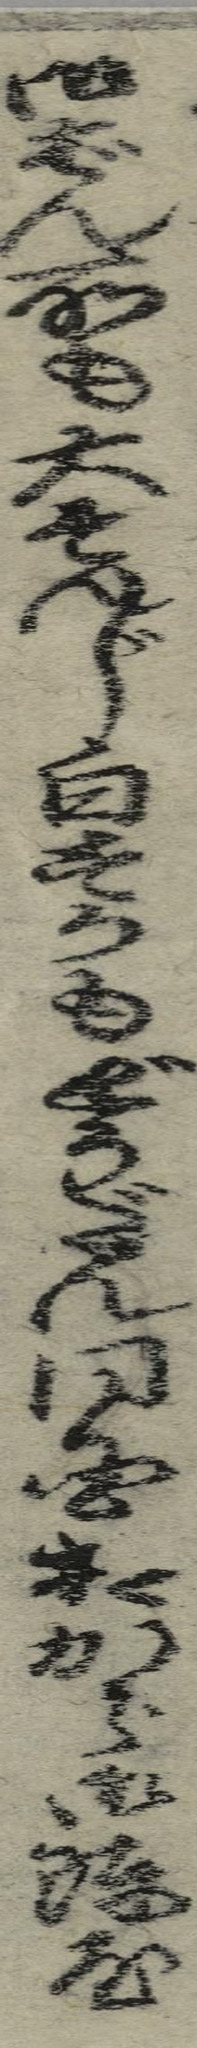御ばん所も大そんじ白すかもどうだん同国たから御陣屋
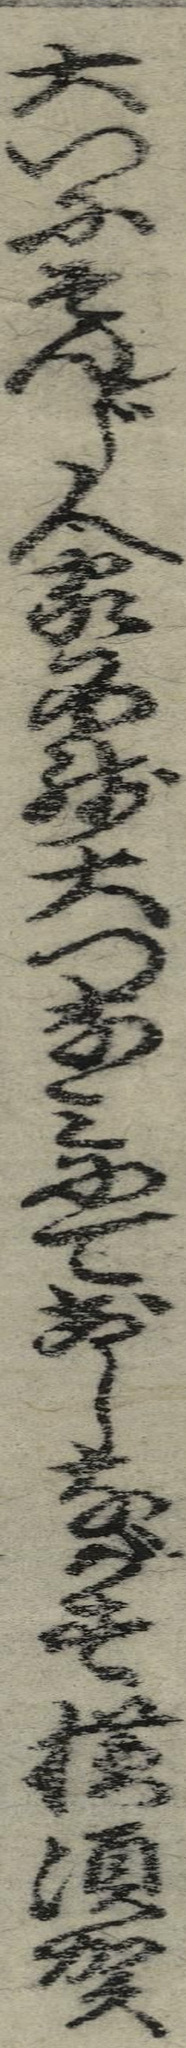大いにそんじ人家不残大つなミにておしながす横須賀
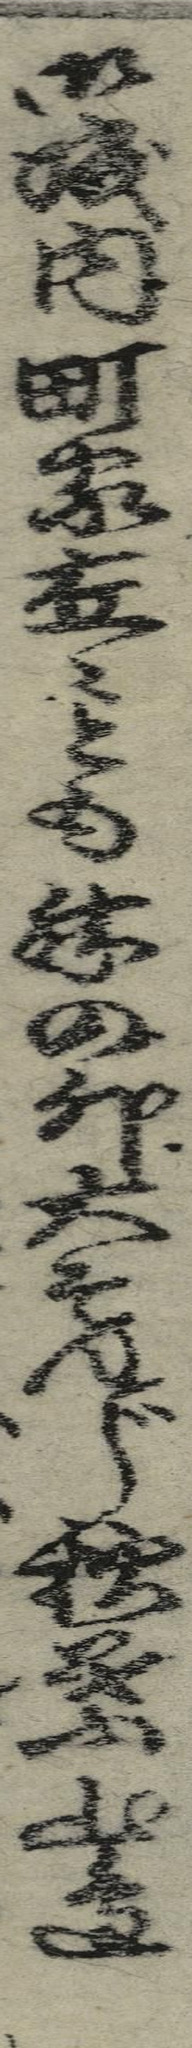御城内町家在々とも殊の外大そんじ秋葉山邊
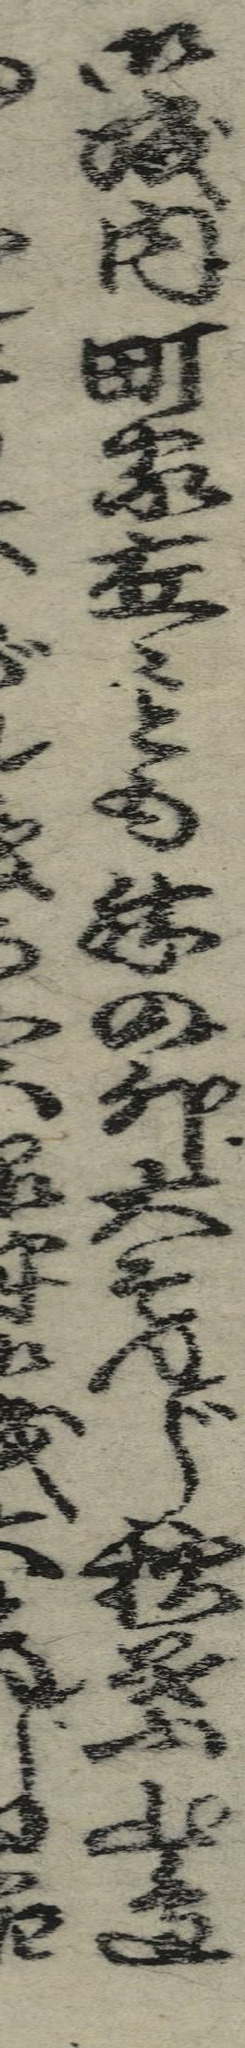御城内町家在々とも殊の外大そんじ秋葉山邊
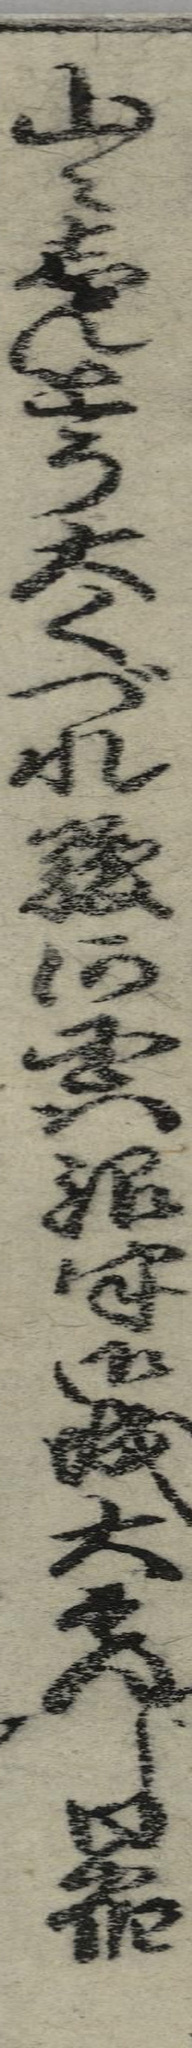山々しんとう大くずれ駿河国ハ沼津御城大そんじ同宿
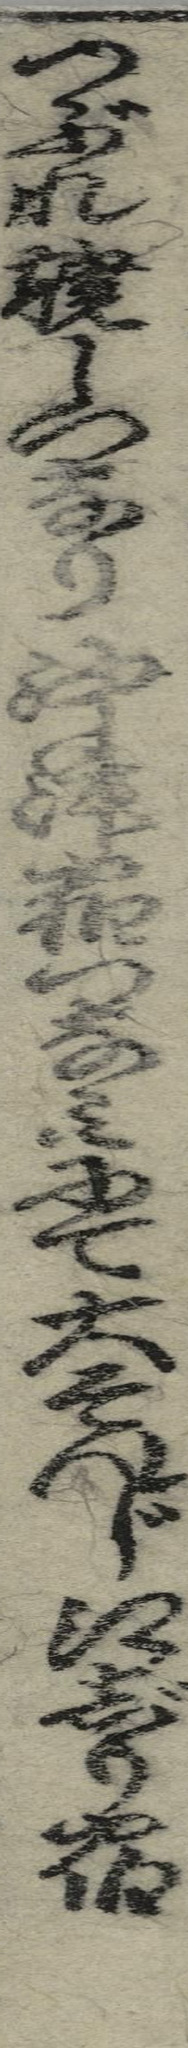つぶれ焼しつなり沖津宿つなミにて大そんじえじり宿
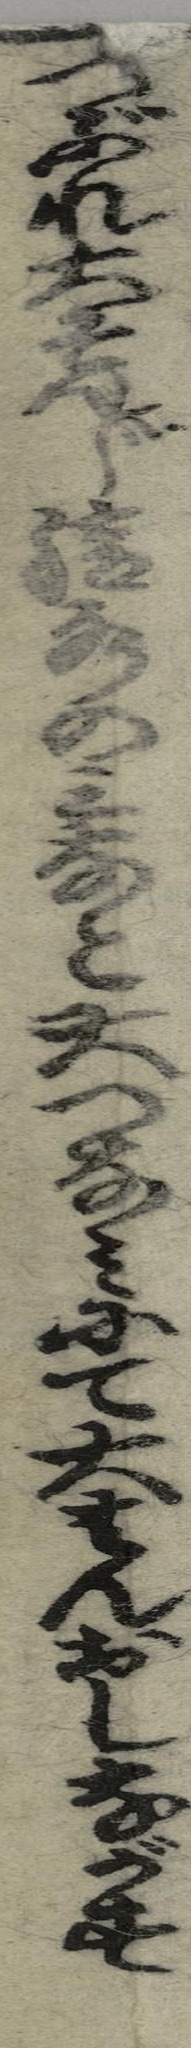つぶれ大そんじ清水のミなと大つなミにて大はんおしながす
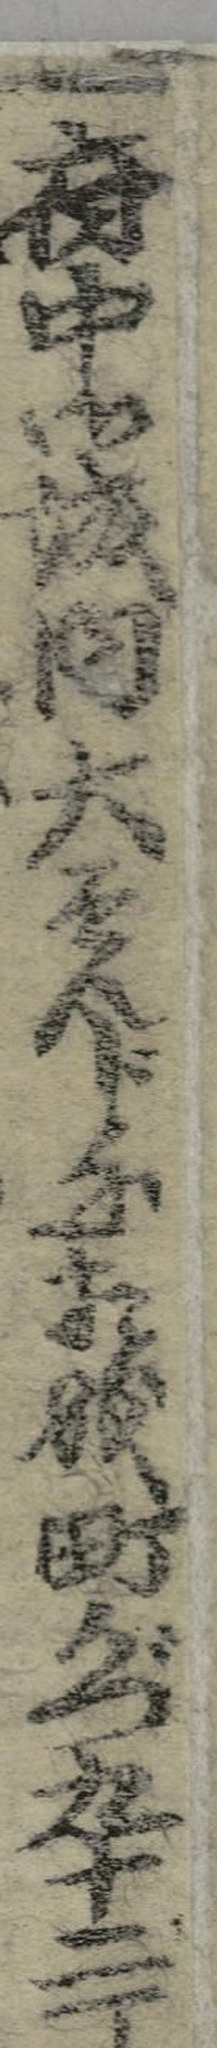府中御城内大そんじ外お城町かづ九十二丁内
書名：諸國大地震并大津浪
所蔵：東京大学地震研究所図書室 Earthquake Research Institute Library, The University of Tokyo, JAPAN
